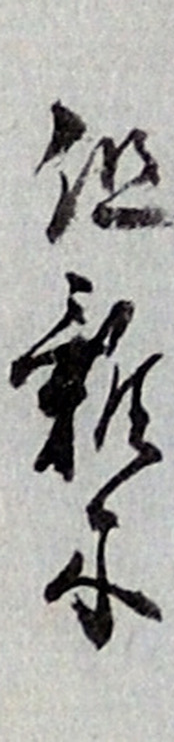但雑木
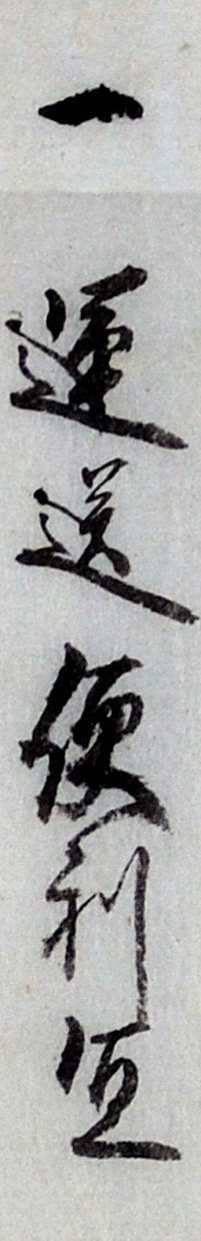一運送便利宜
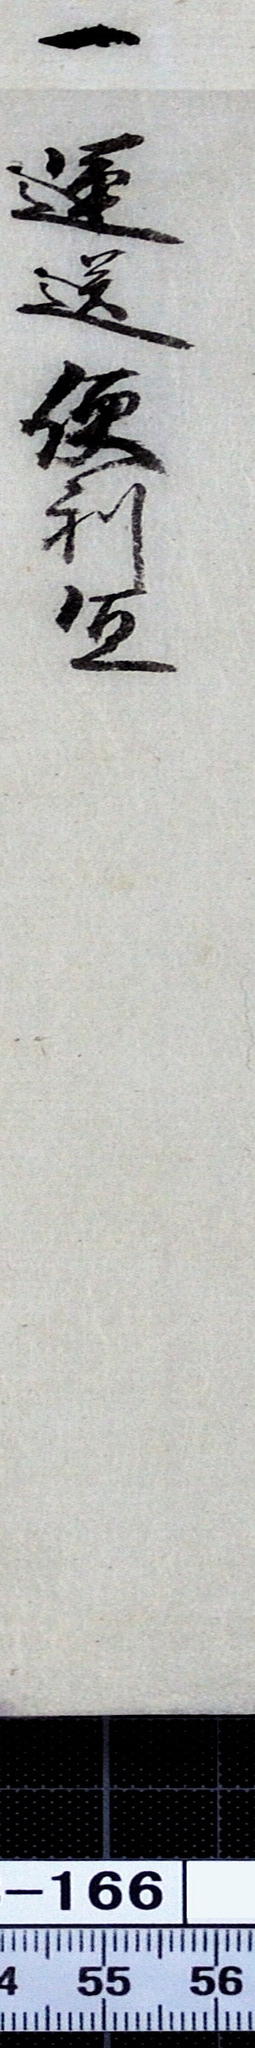一運送便利宜
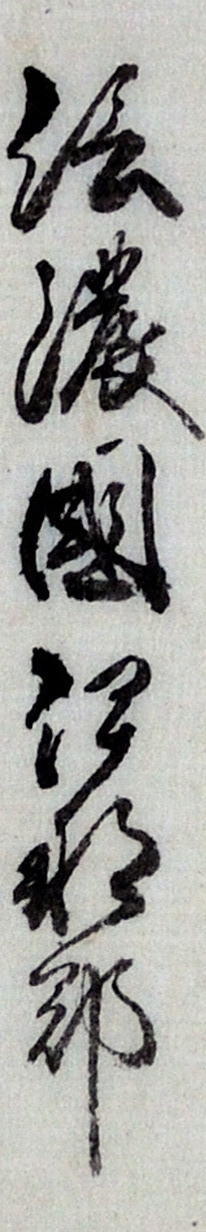信濃国伊那郡
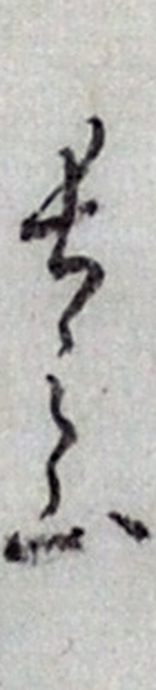長之山
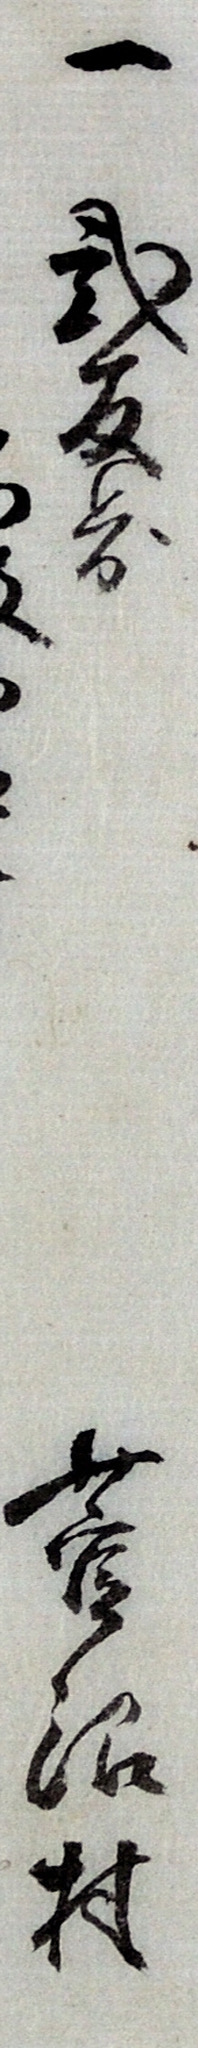一弐反歩菅沼村
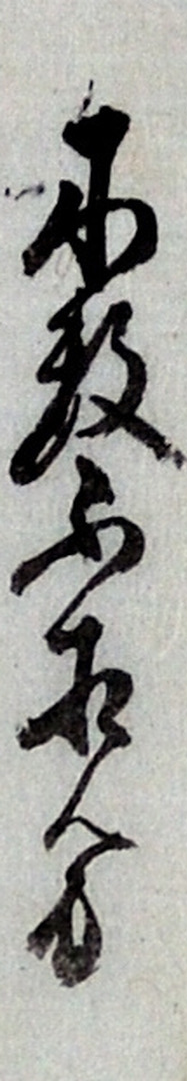木数不相分
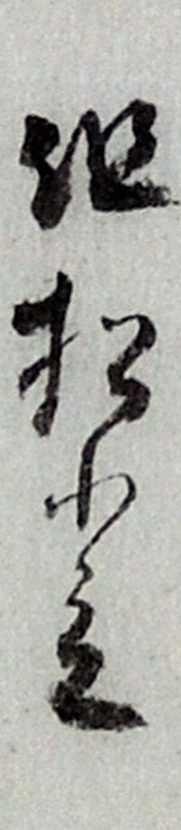但松小立
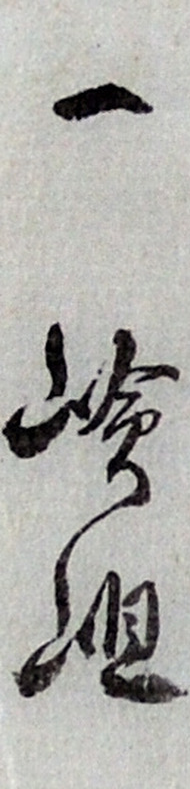一嶮岨

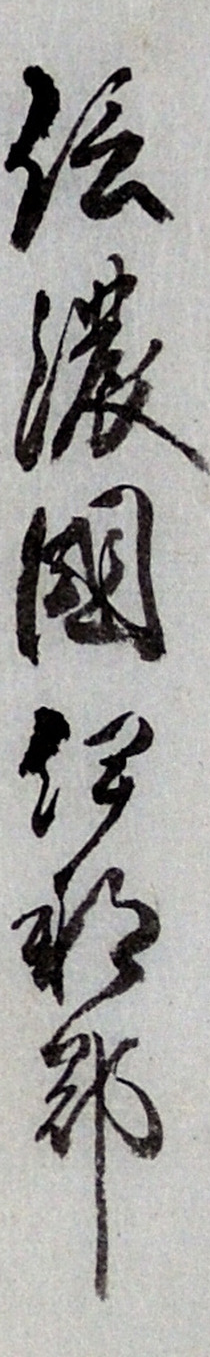信濃国伊那郡
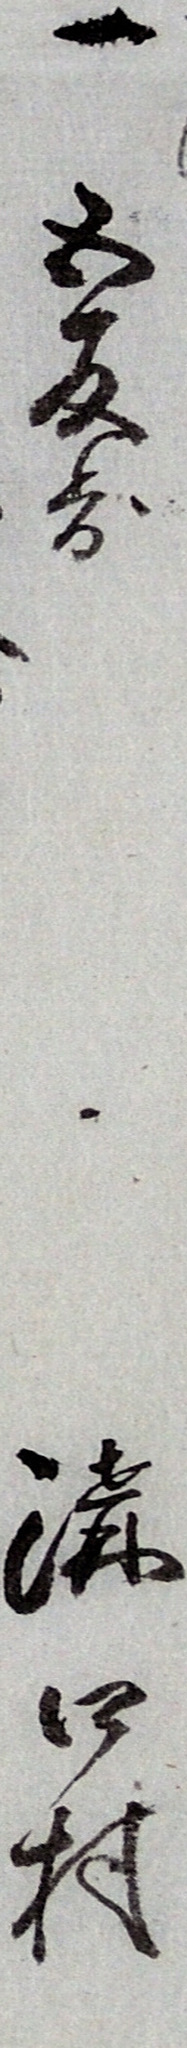一五反歩溝口村
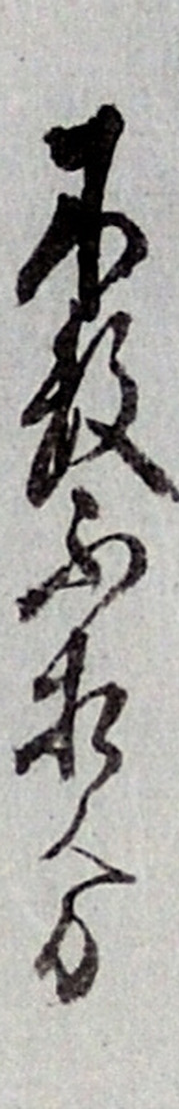木数不相分
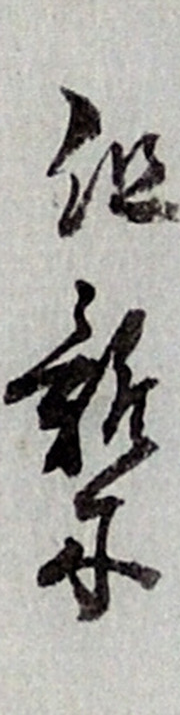但雑木
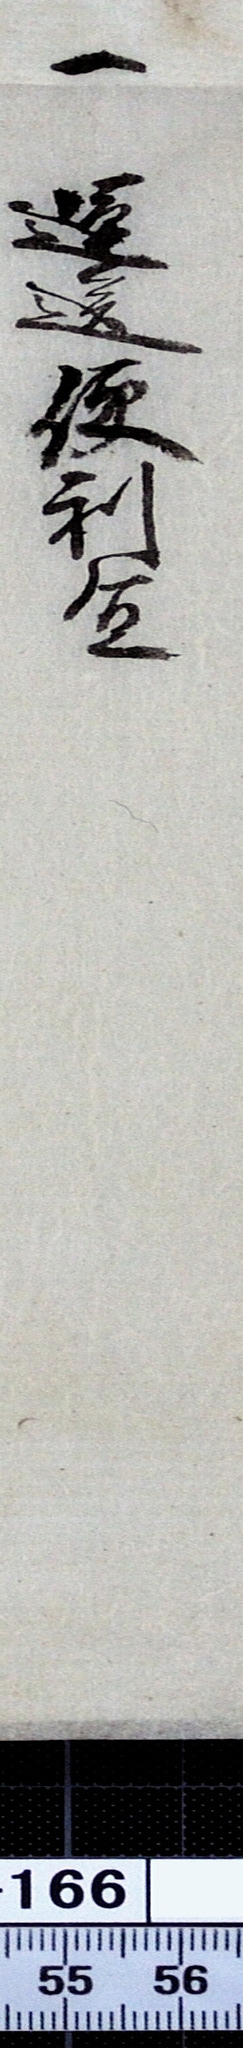一運送便利宜
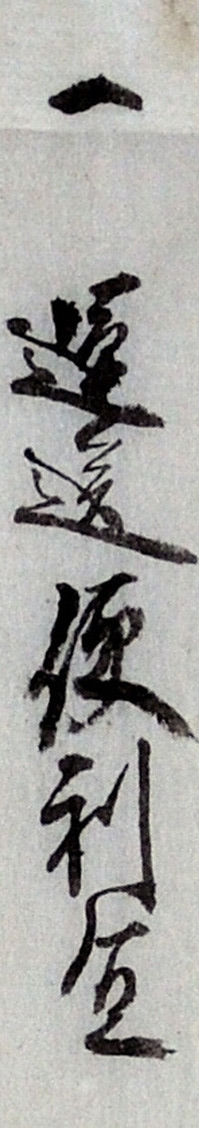一運送便利宜
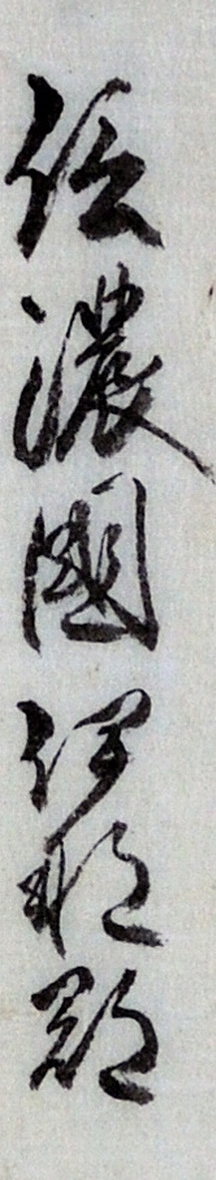信濃国伊那郡
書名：官林反別帳
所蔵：伊那市立高遠町図書館・合同会社AMANE
